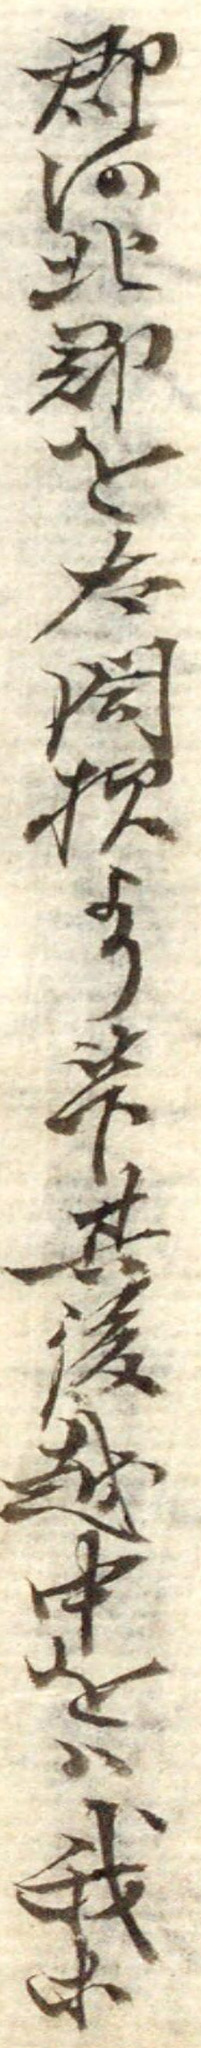郡河北郡を太閤様より被下其後越中をは我等
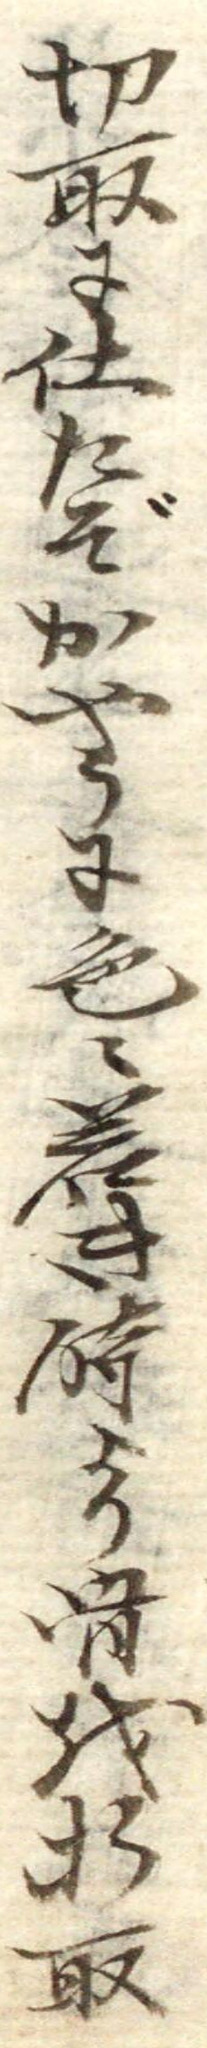切取尓仕たぞかやう尓色々若き時より骨越折取
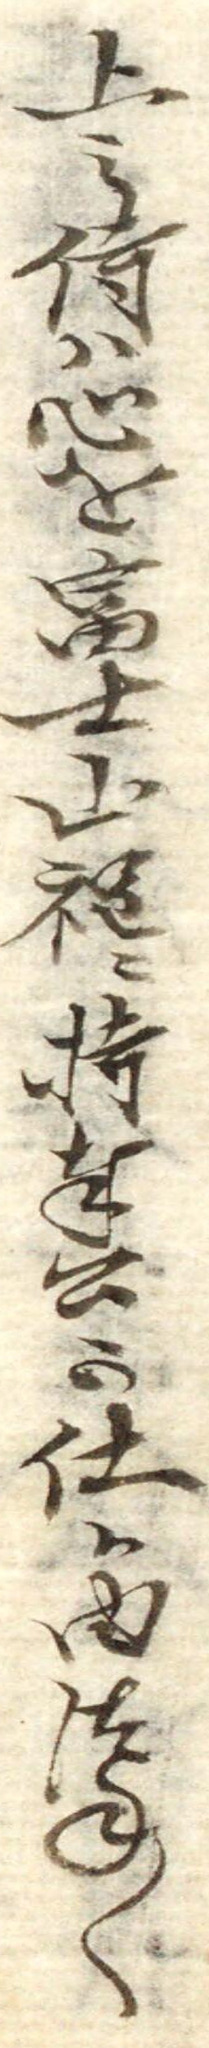上之侍は心を富士山程に持奉公可仕候由佐手〳〵
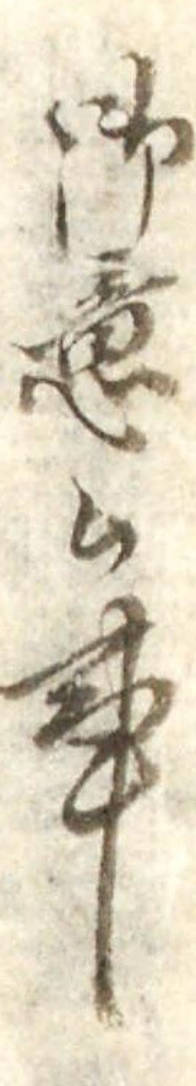御意候事
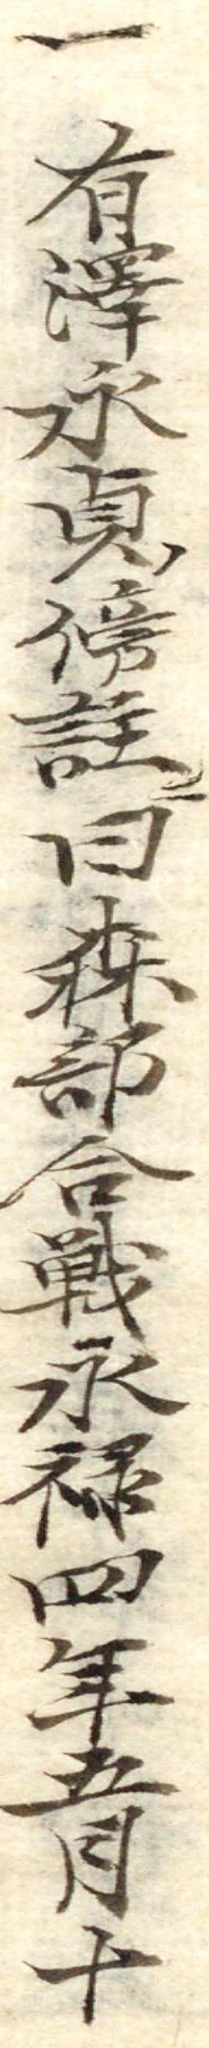一有澤永貞の傍註に曰森部合戦永禄四年五月十
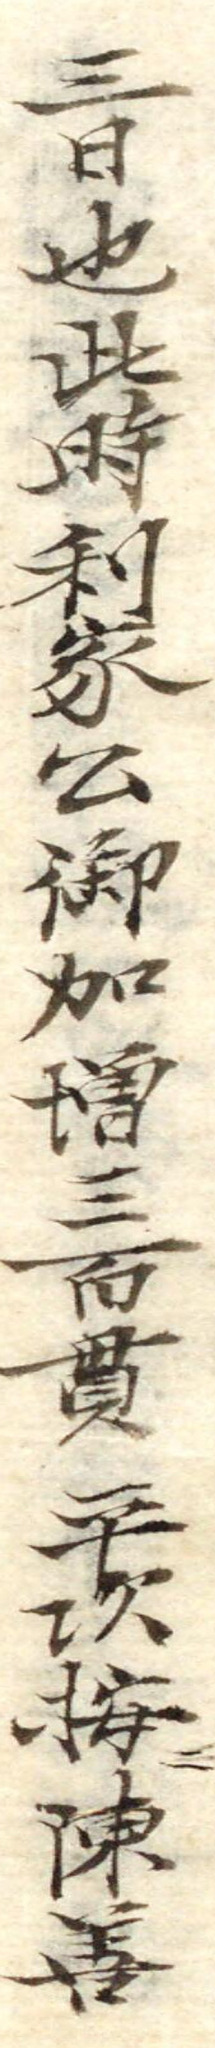三日也此時利家公御加増三百貫平次按に陳善
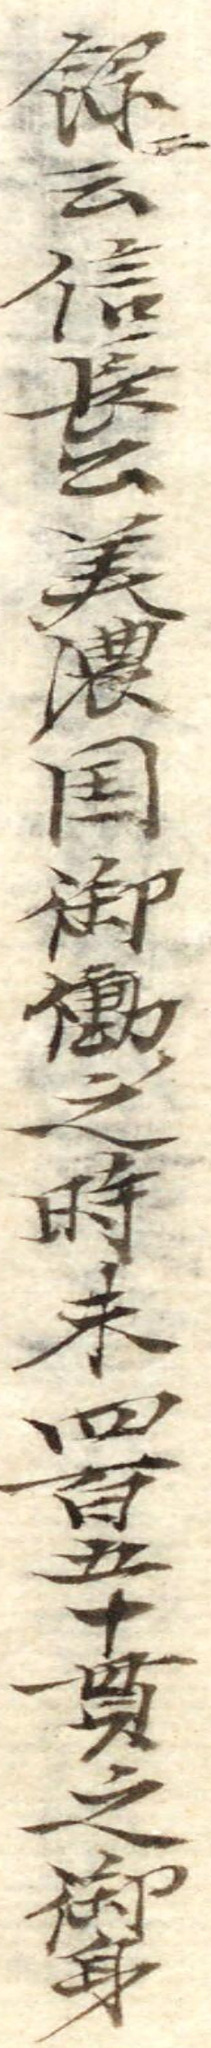録に云信長公美濃国御働之時未四百五十貫之御見
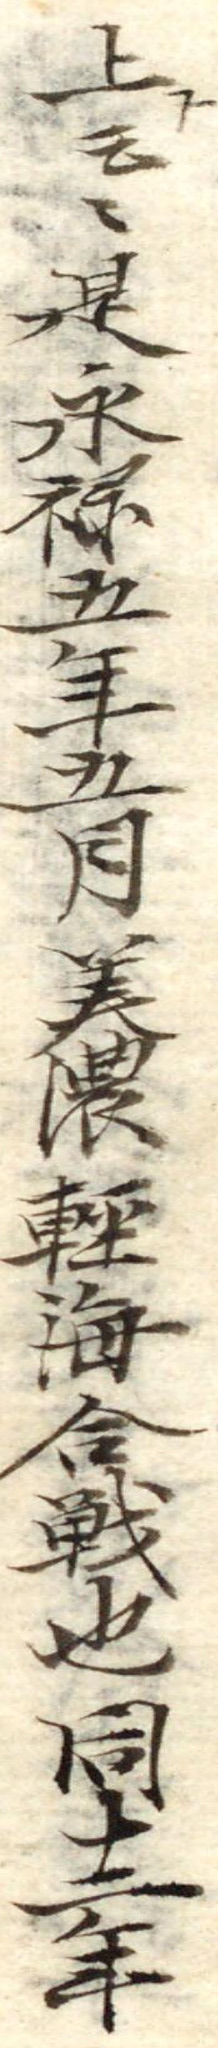上と云々是永禄五年五月美濃軽海合戦也同十二年
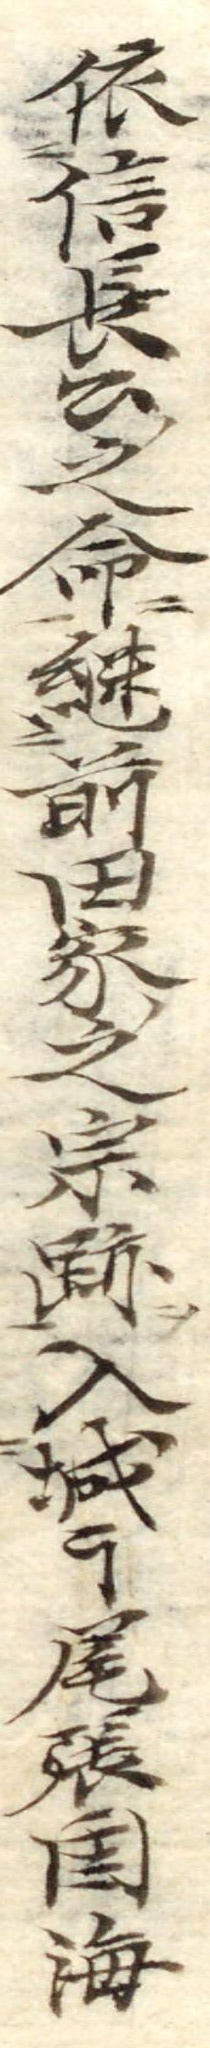依信長公之命に継前田家之宗跡を入城干尾張国海
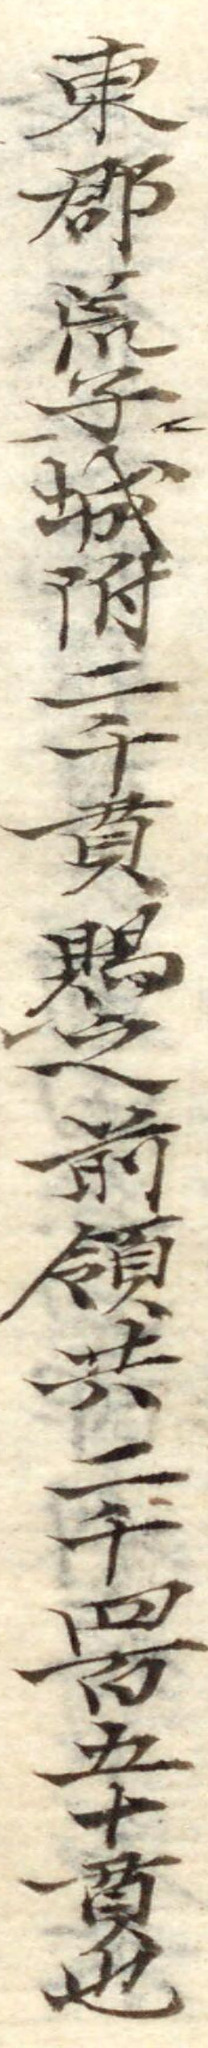東郡荒子に城附二千貫賜之前領共二千四百五十貫也
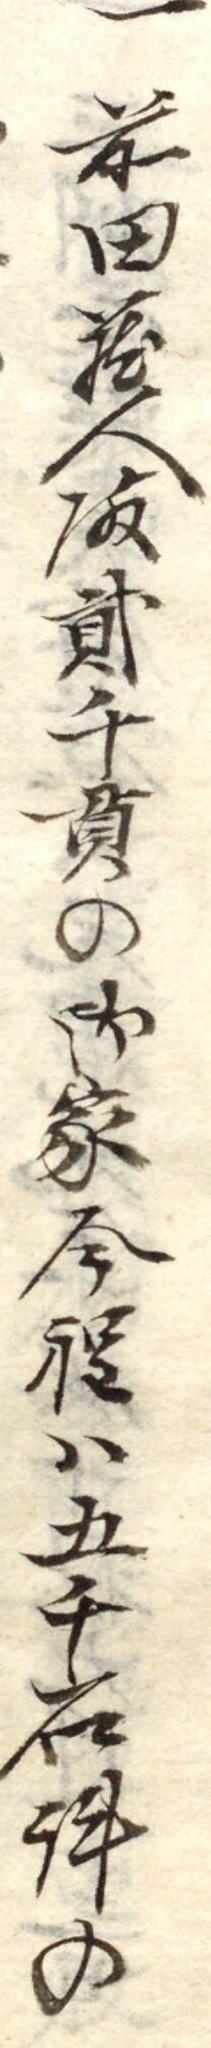一前田蔵人殿貳千貫の御家今程は五千石許の
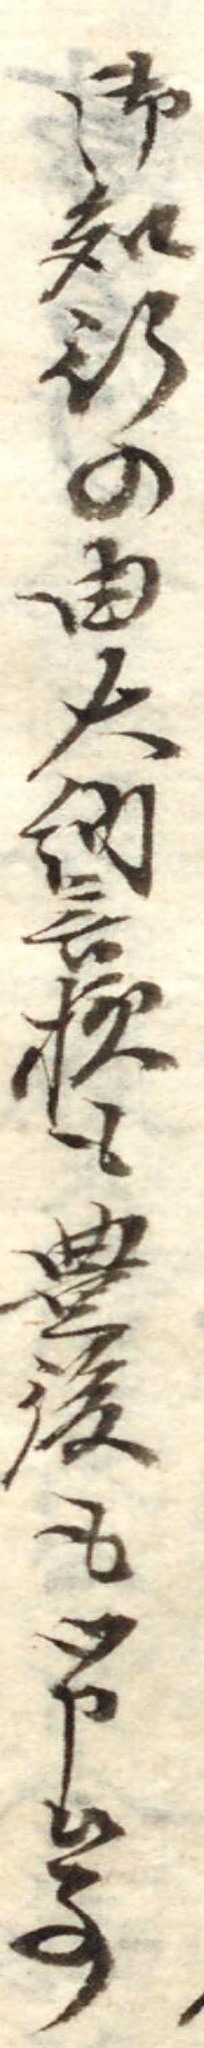御知行の由大納言様も豊後も御申候事
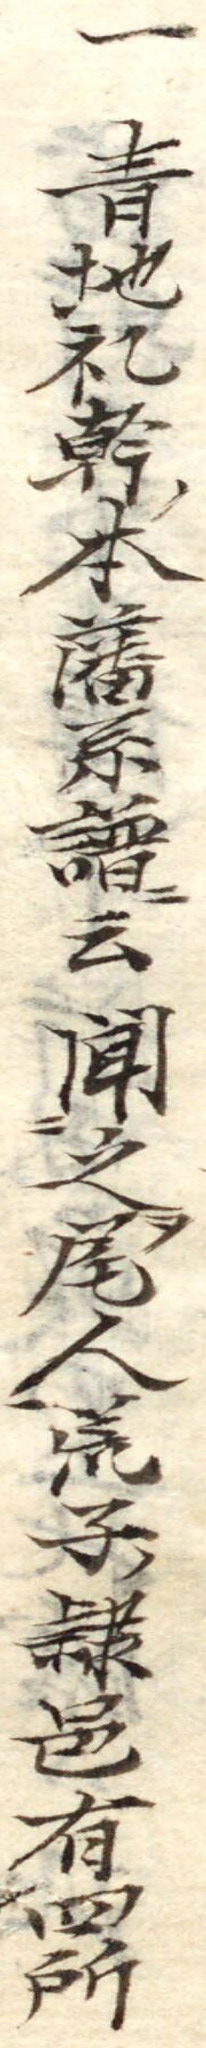一青地礼幹の本藩系譜に云聞之尾人荒子の隷邑有四所
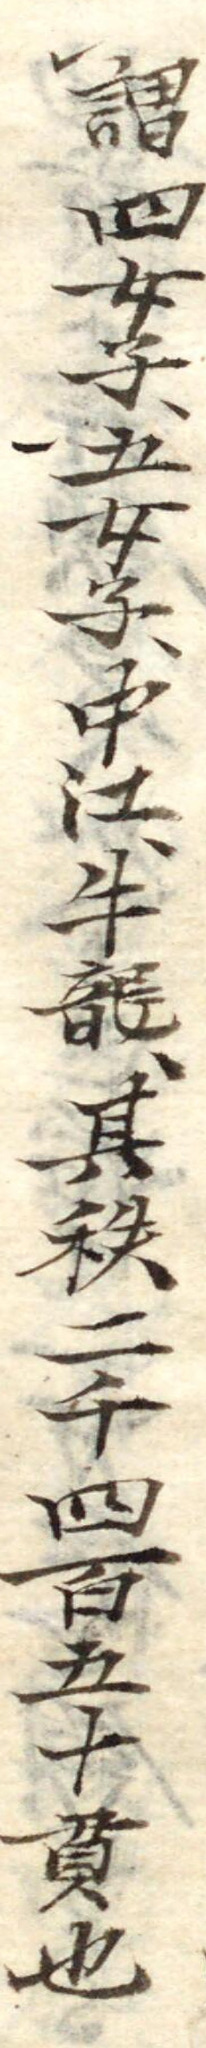レ謂四女子、五女子、中江、牛龍、其秩二千四百五十貫也
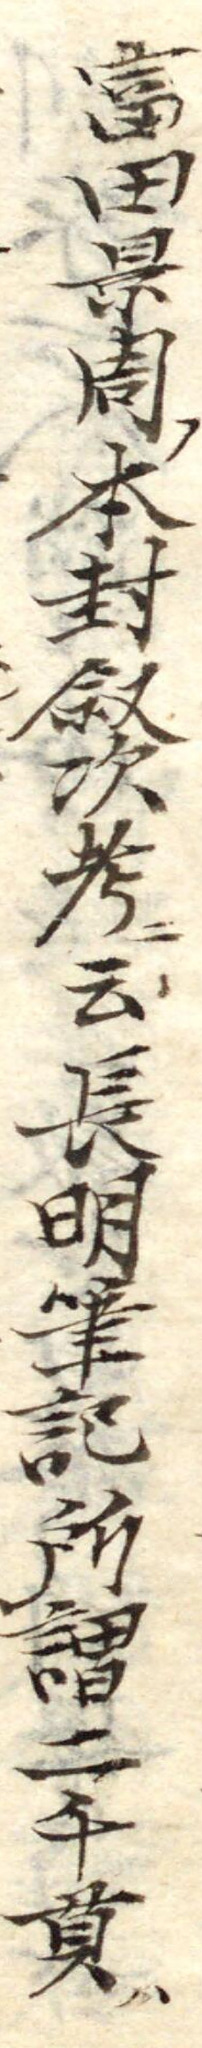冨田景周の本封叙次考に云長明筆記所謂二千貫は
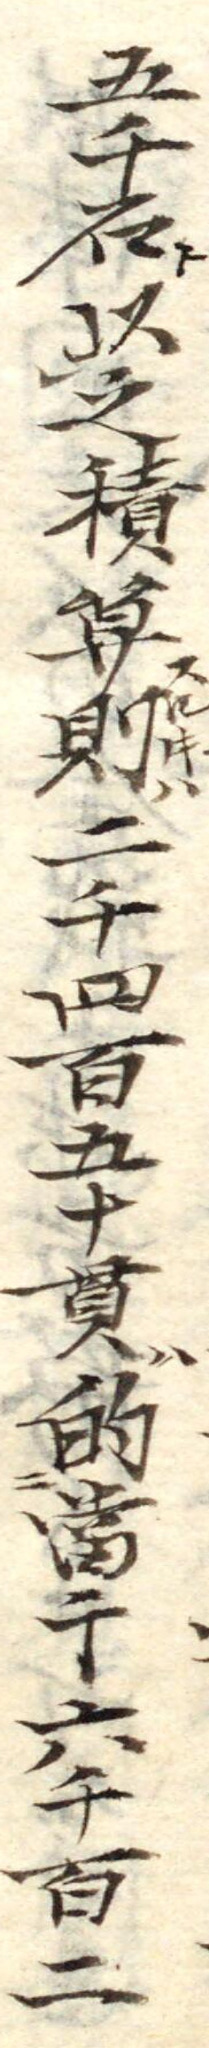五千石と以之積算則二千四百五十貫は的当干六千百二
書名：前田家封国証書集録
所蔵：Ishikawa Prefectural Library
